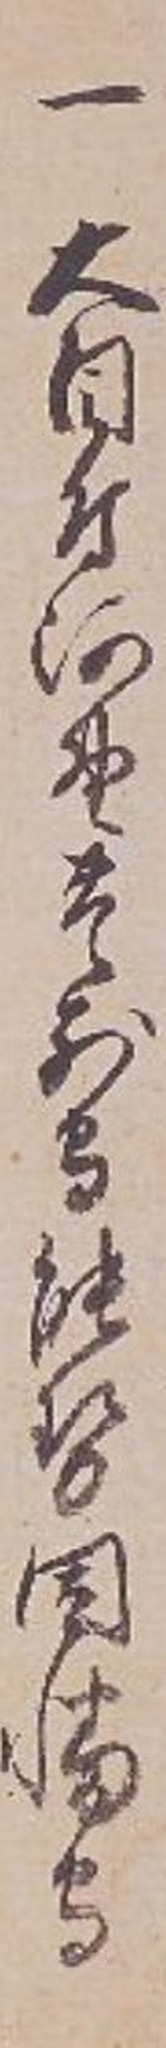一大目付河野豊前守能勢因幡守
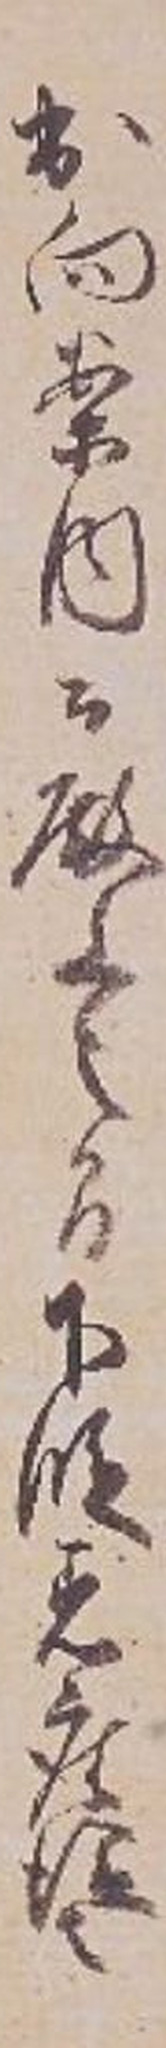出向案内而殿上之間下段着座後は
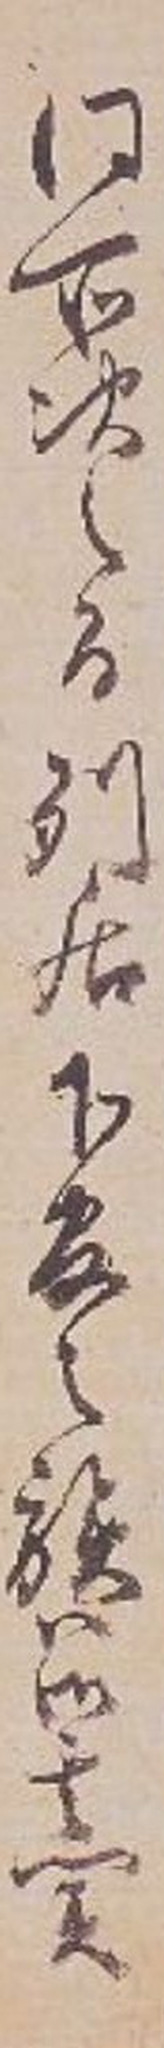同所次之間列居下官之族は御玄関
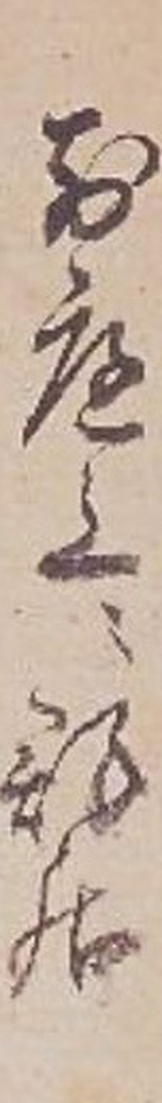前庭上に部居
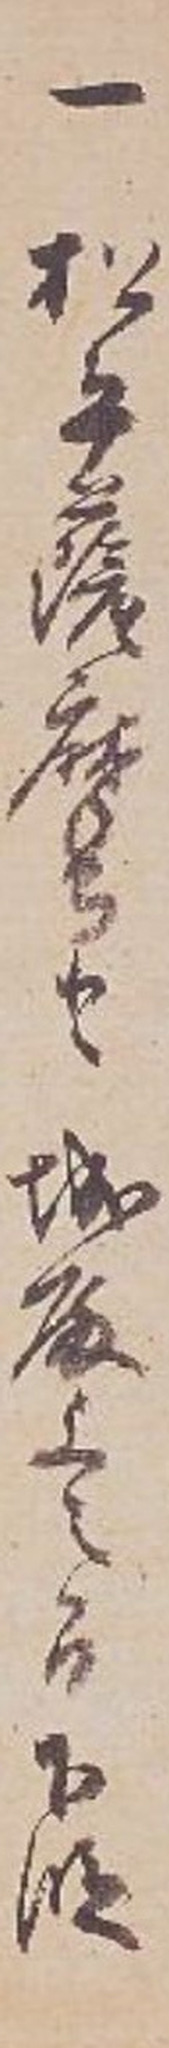一松平薩摩守登城殿上之間下段
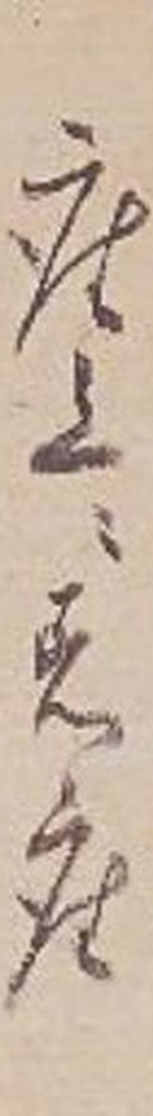座上に着座
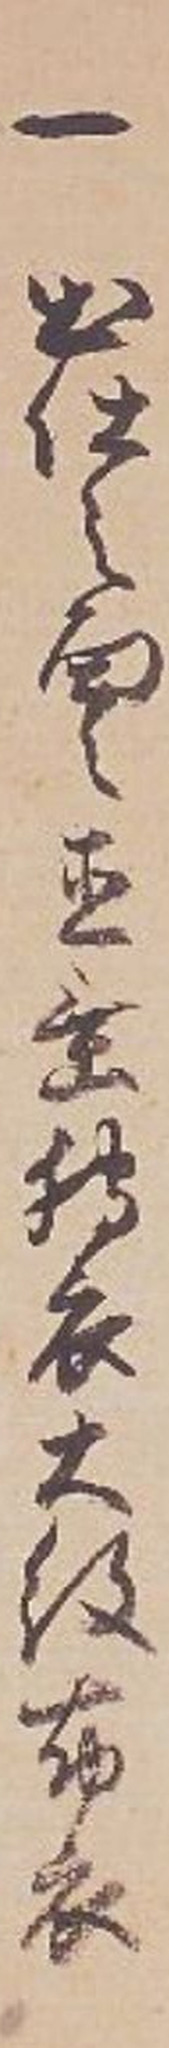一出仕之面々直垂狩衣大紋布衣
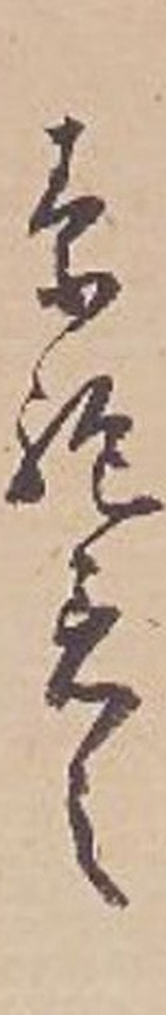素袍着之
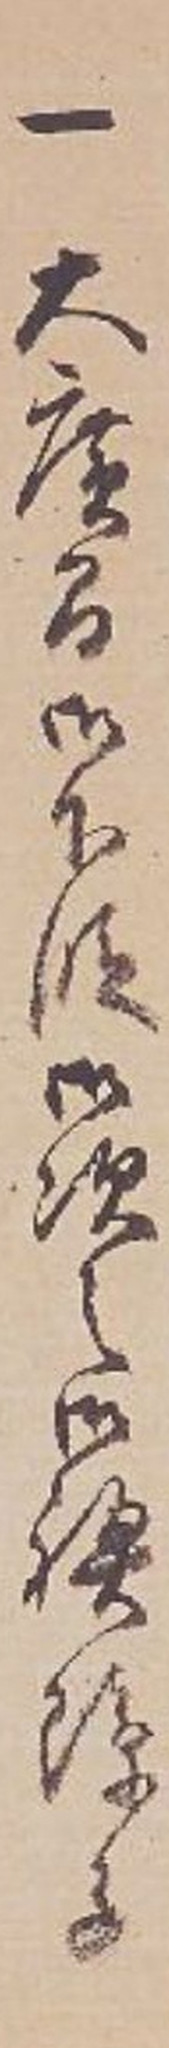一大広間御下段御次之御襖障子
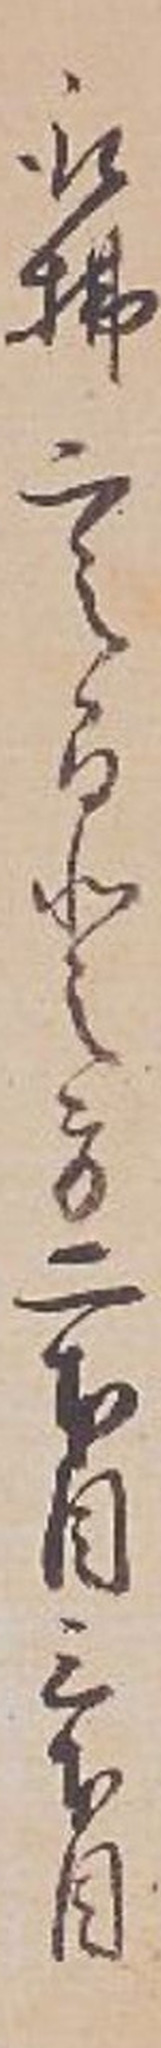取払二之間北之方二本目三本目
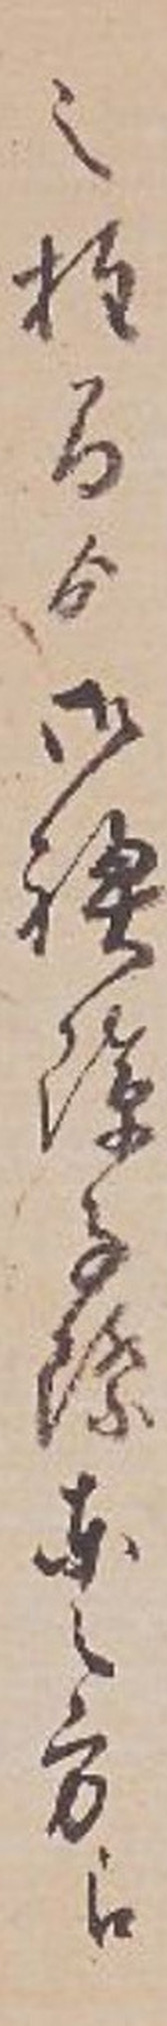之柱間ゟ御襖障子際東之方え
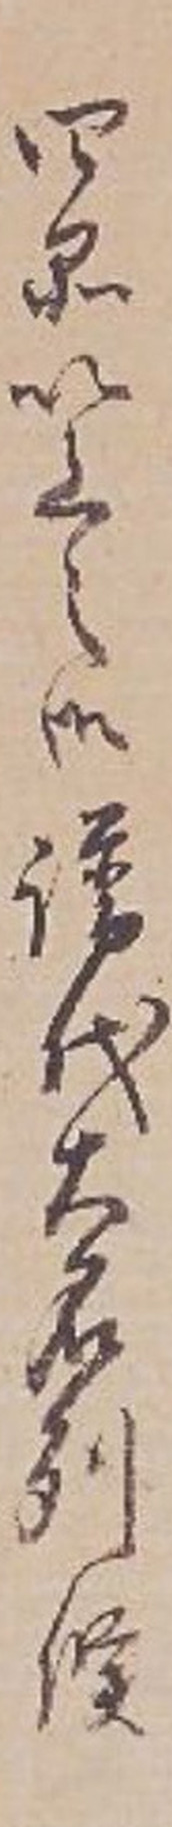四品以上之御譜代大名列侯

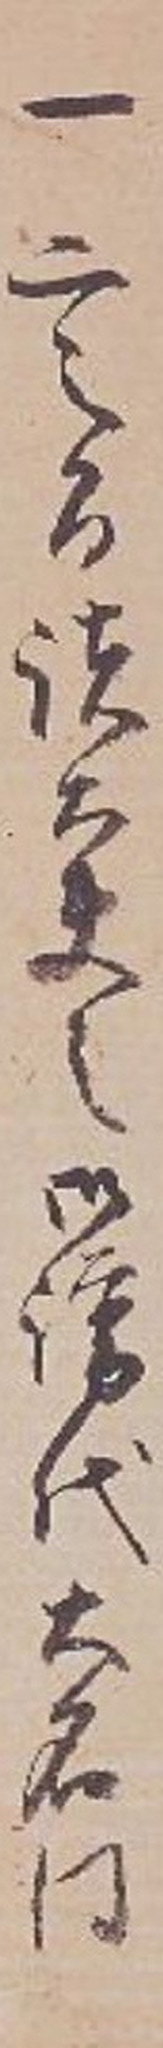一二之間諸大夫之御譜代大名同
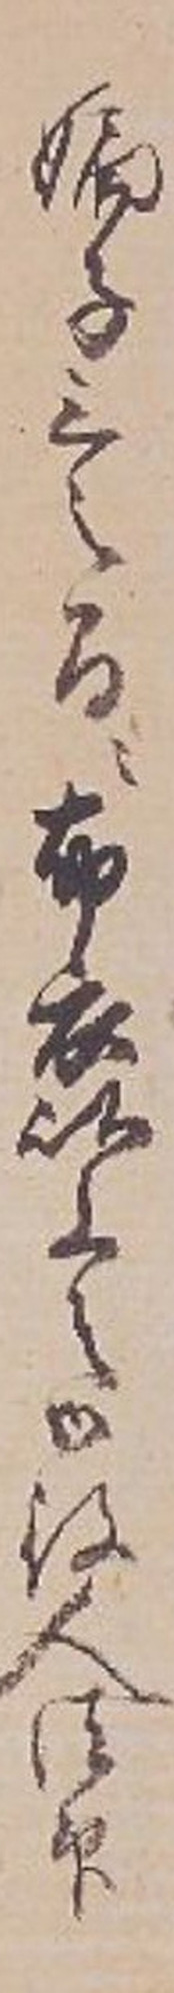嫡子三之間に布衣以上之御役人法印
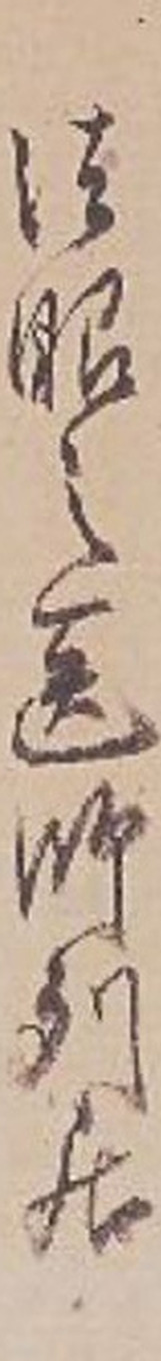法眼之医師列居
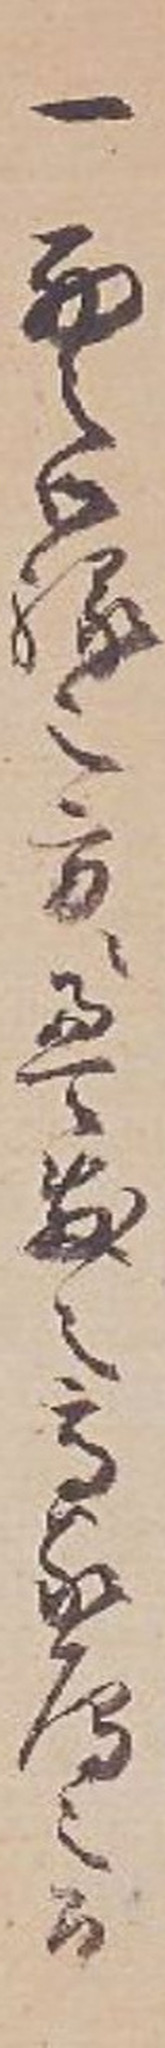一西之御縁之方に畳敷之高家雁之間
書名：琉球人来朝記 八、九
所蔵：University of the Ryukyus Library
